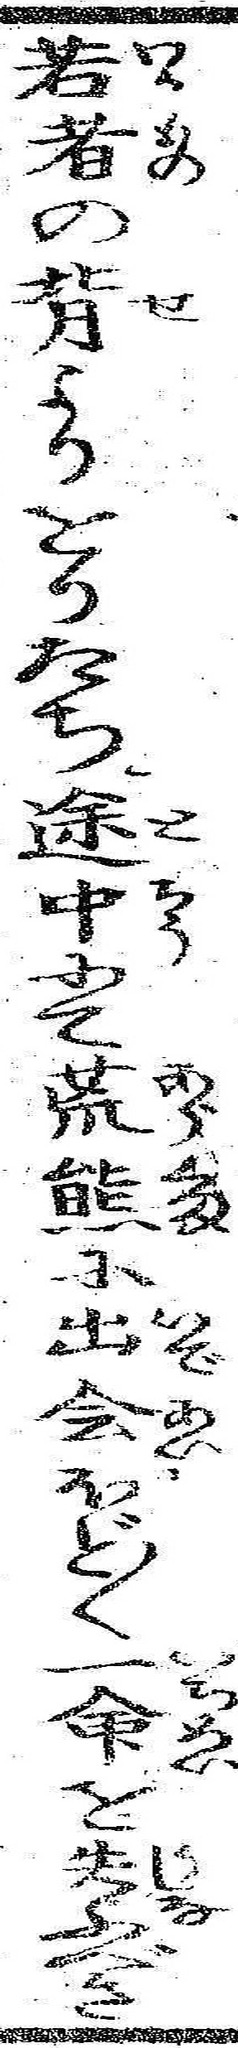若者の背よりをりたち。途中にて荒熊に出会ほど〳〵命を失ふべき
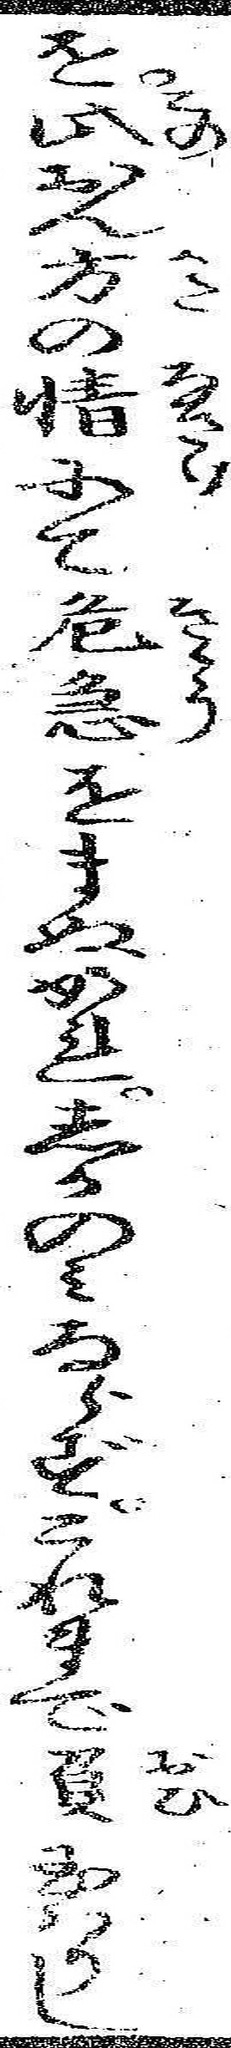を。此おん方の情にて危急をまぬかれ。しかのみならず。これまで負玉はりし
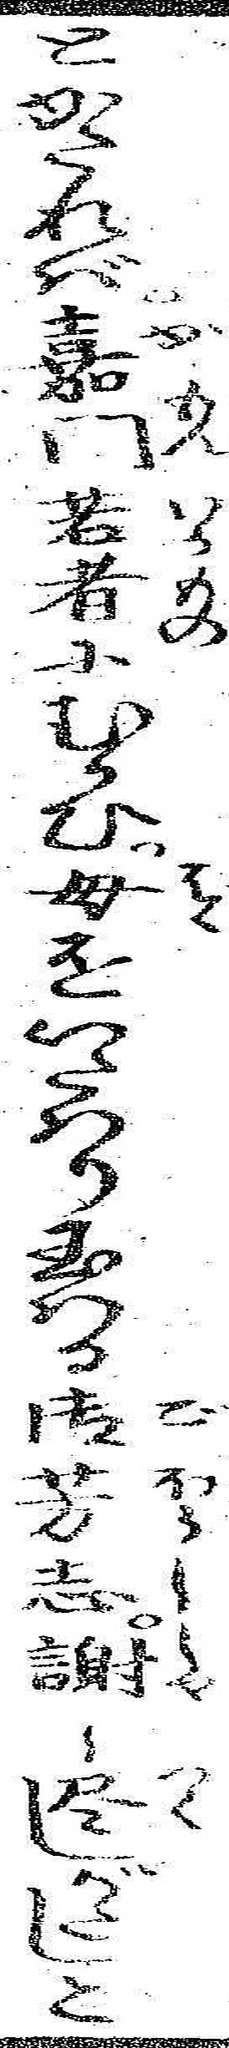とかたれば。嘉門若者にむかひ。母をいたはり玉はる御芳志。謝し尽しがたしと
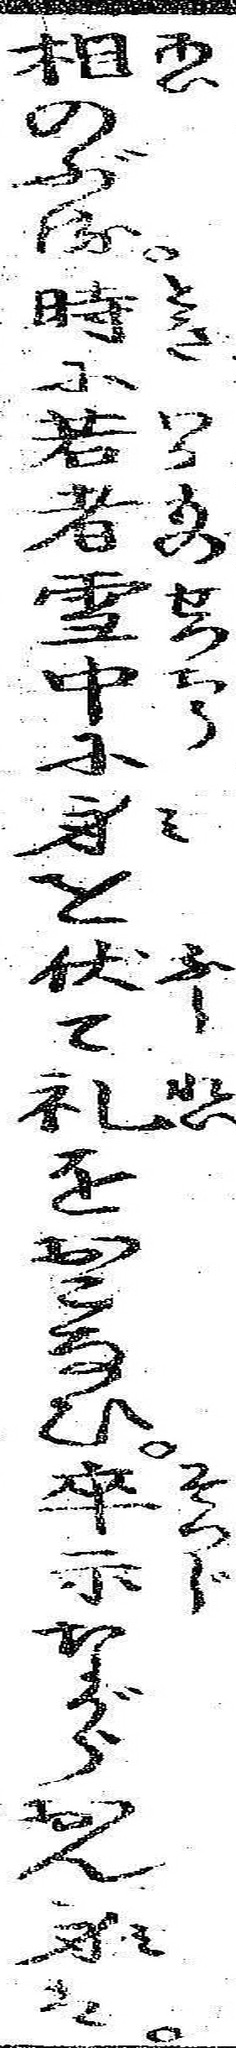相のぶる。時に若者雪中に身を伏て礼をおこなひ。卒示ながらおん身は。
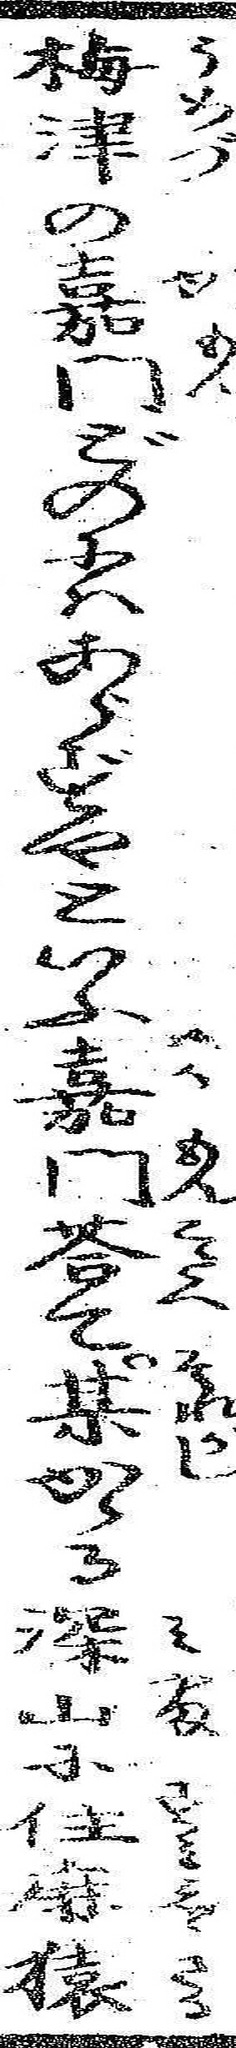梅津の嘉門どのにはあらずやといふ。嘉門荅て。某かゝる深山に住鹿猿
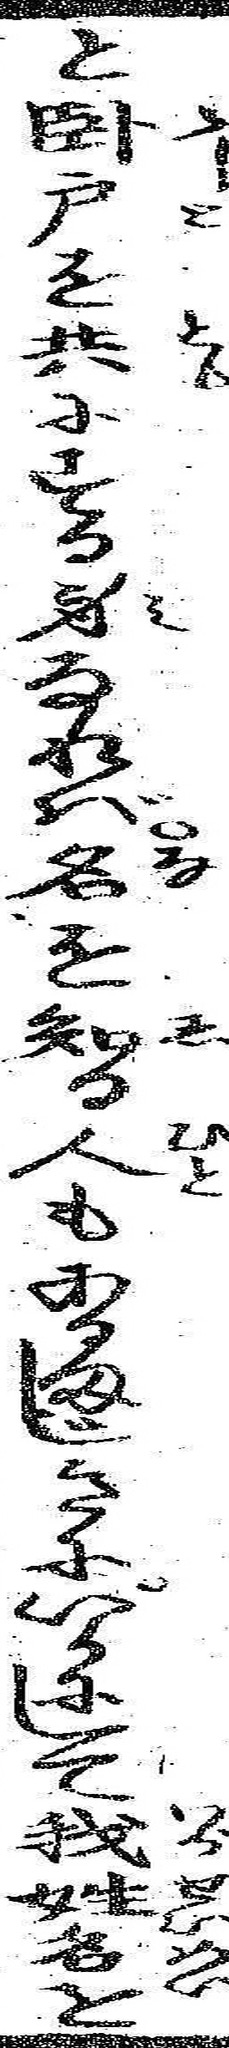と臥戸を共にする身なれば。名を知る人もあるまじきに。いかにして我姓名を
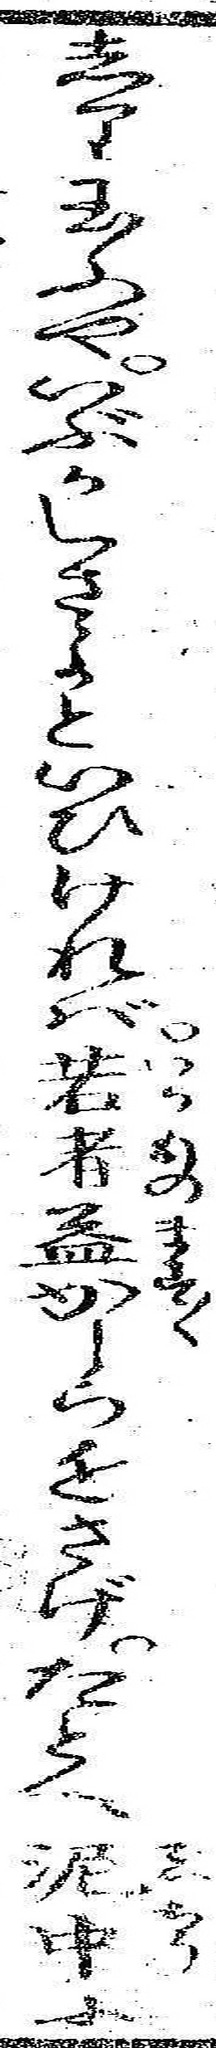しり玉ふや。いぶかしさよといひければ。若者益かしらをさげ。たとへ泥中に
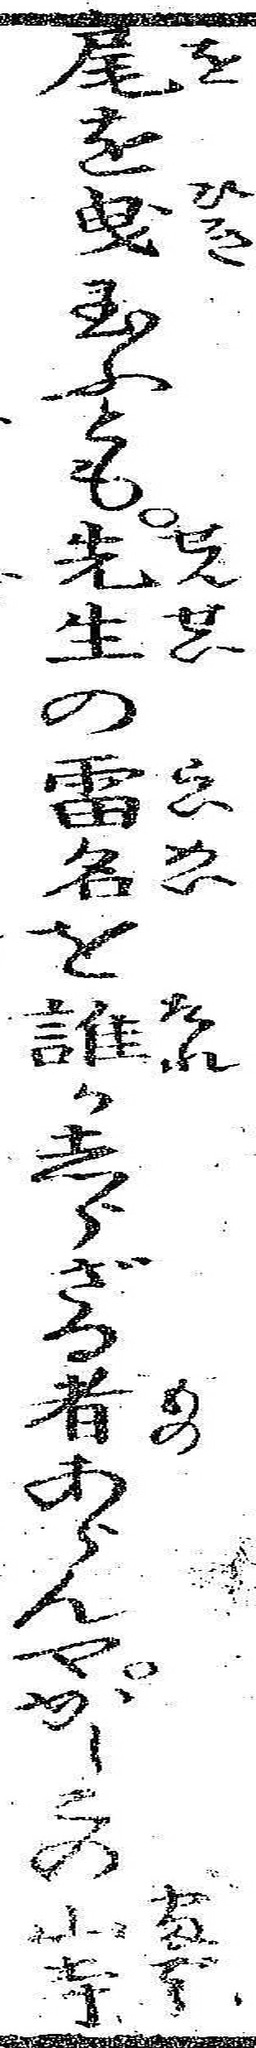尾を曳玉ふとも。先生の雷名を誰かしらざる者あらんや。かしこの山寺
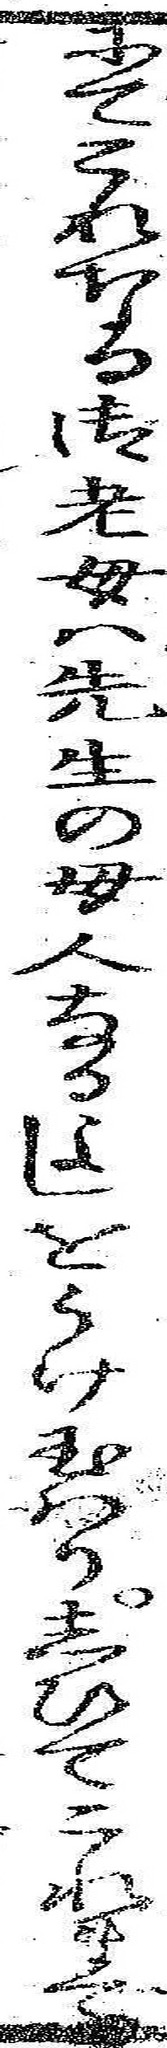にてこれなる御老母は。先生の母人なるよしをうけ玉はり。しひてこれまで
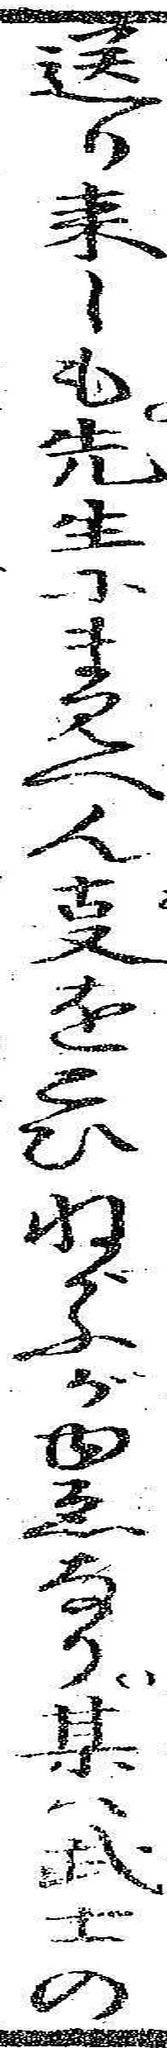送り来しも。先生にま見へん事をこひねがふがゆゑなり。某は武士の
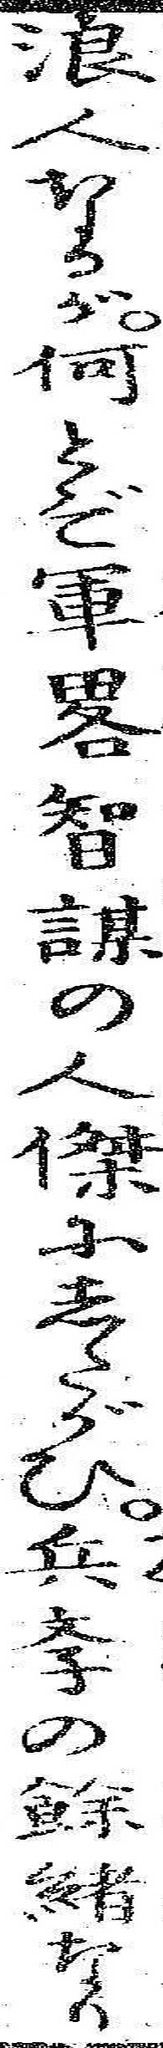浪人なるが。何とぞ軍略智謀の人傑にしたがひ。兵学の余緒なり
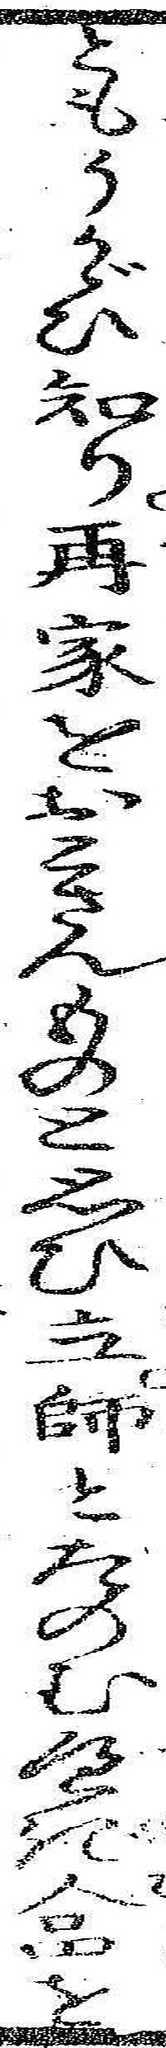ともうかゞひ知り。再家をおこさんものと思ひ立。師とたのむべき人品を
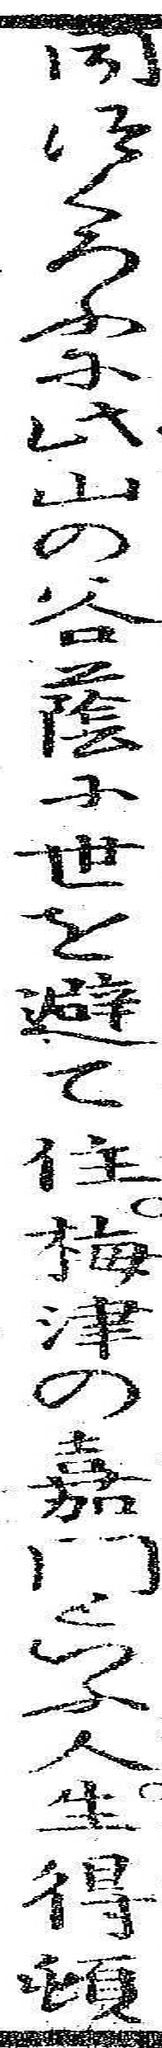聞つくろふに。此山の谷蔭に世を避て住。梅津の嘉門といふ人。生得頓
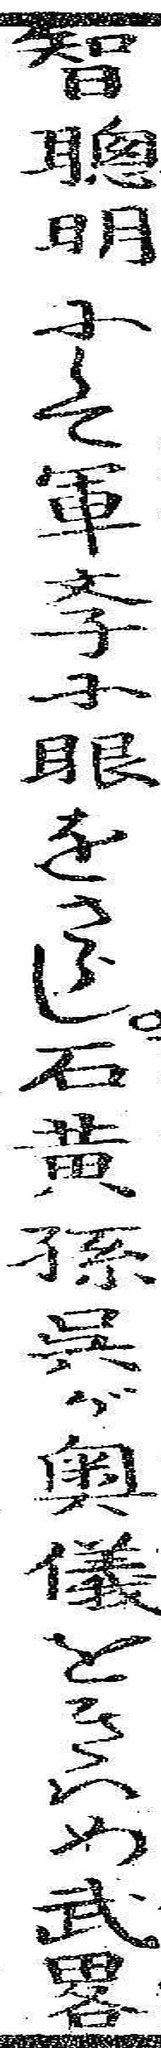智聡明にして。軍学に眼をさらし。石黄孫呉が奥儀をきはめ。武略
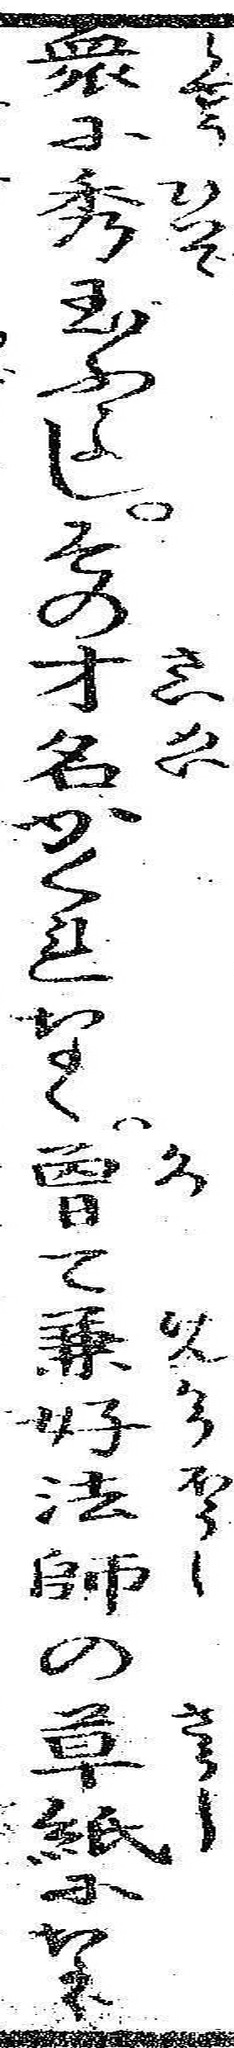衆に秀玉ふよし。その才名かくれなく。曽て兼好法師の草紙になら
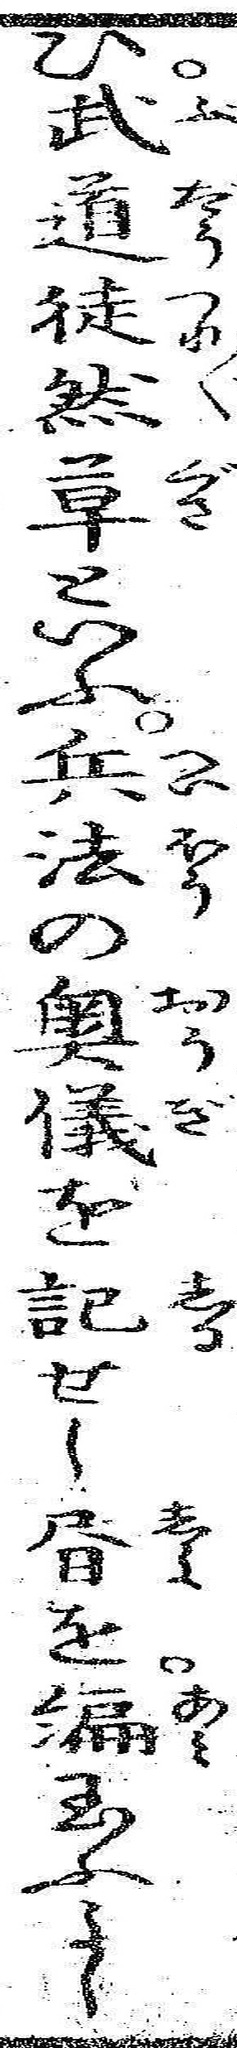ひ。武道徒然草といふ。兵法の奥儀を記せし書を。編玉ふよし
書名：昔話稲妻表紙
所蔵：国文学研究資料館
